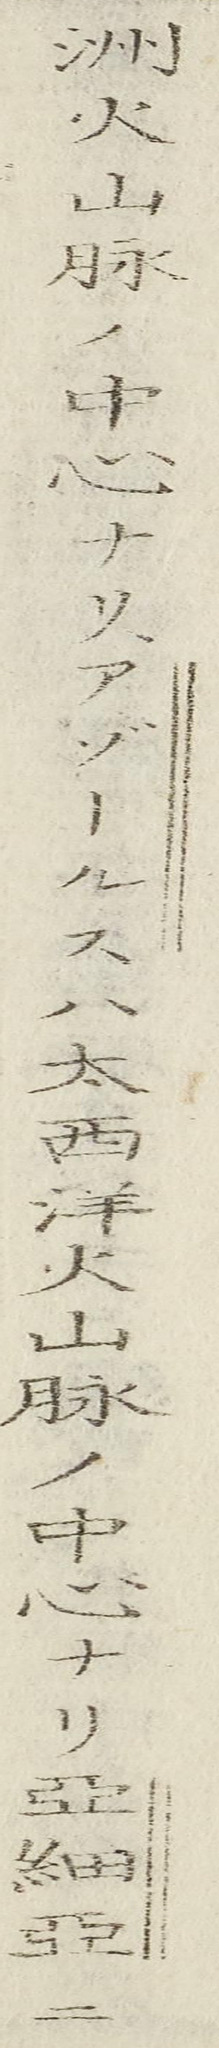洲火山脉ノ中心ナリ、アゾールスハ大西洋火山脉ノ中心ナリ亜細亜ニ
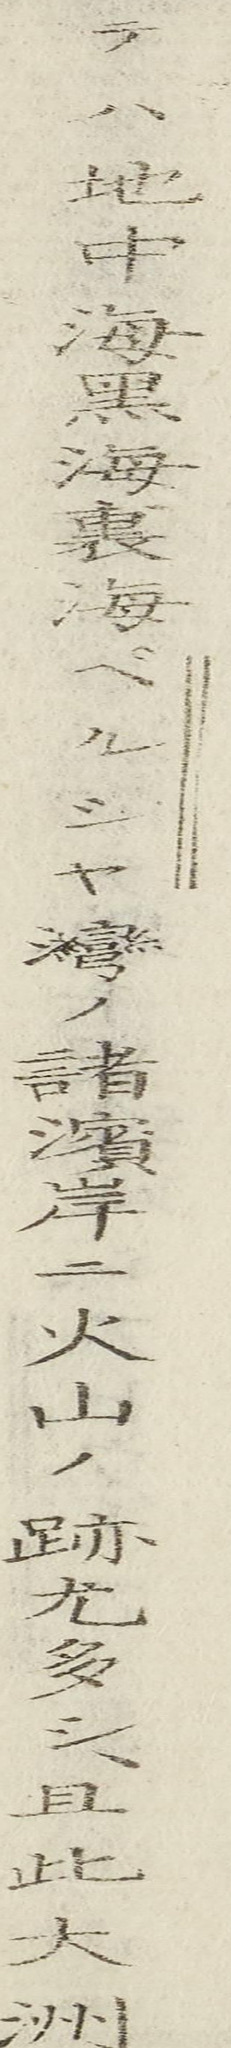テハ地中海黒海裏海ペルシヤ湾ノ諸浜岸ニ火山ノ跡尤多シ、且此大洲
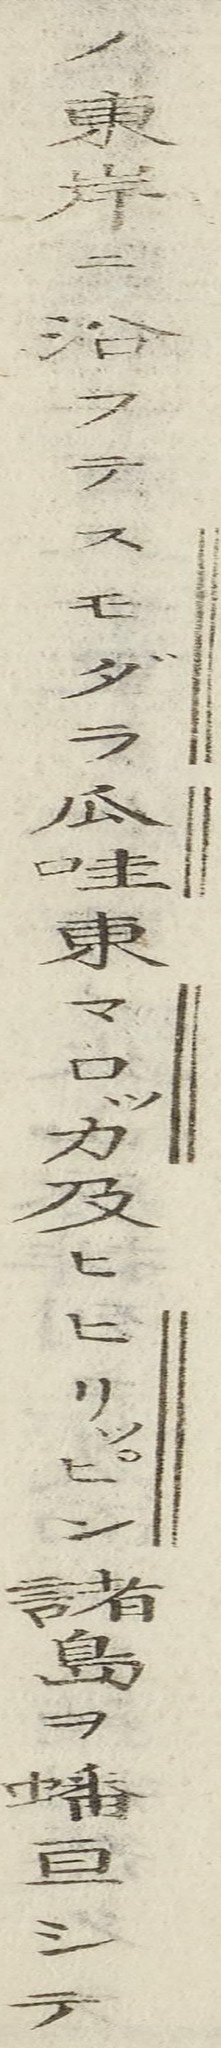ノ東岸ニ沿フテスモダラ瓜哇東マロッカ及ヒヒリッピン諸島ヲ蟠亘シテ

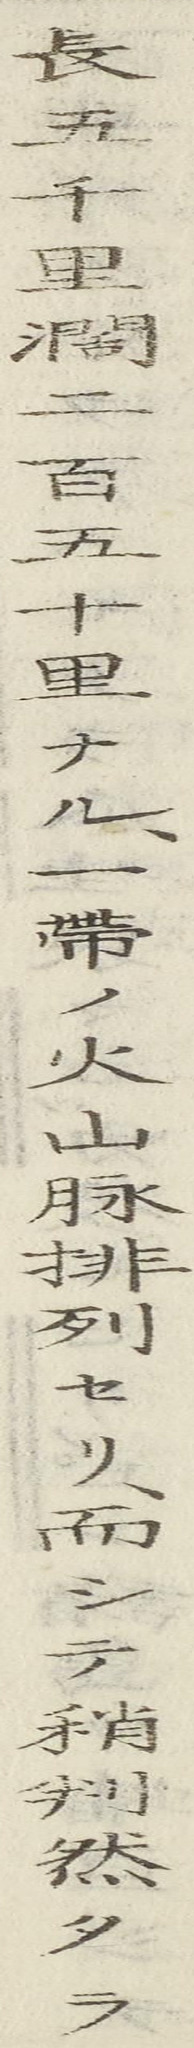長五千里濶二百五十里ナル、一帯ノ火山脉排列セリ、而シテ稍判然タラ
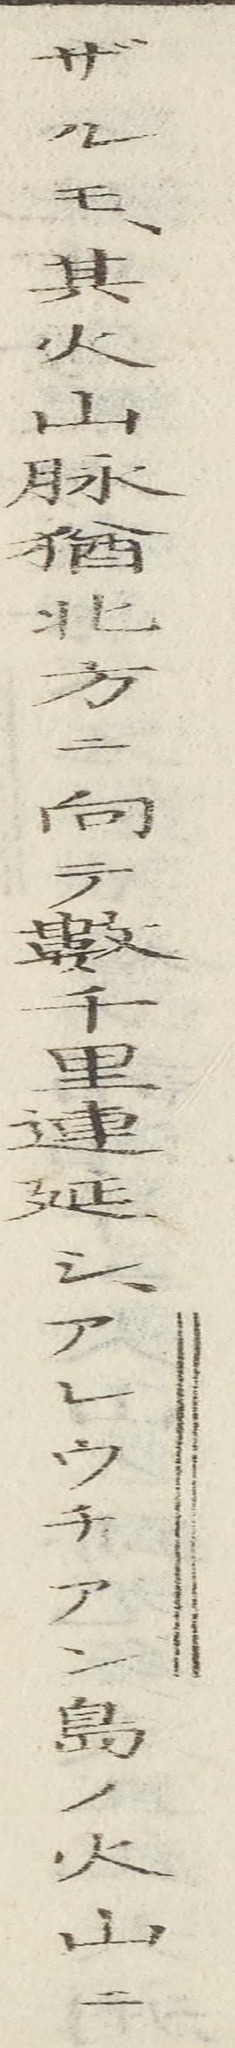ザルモ、其火山脉猶北方ニ向テ数千里連延シ、アレウチアン島ノ火山ニ
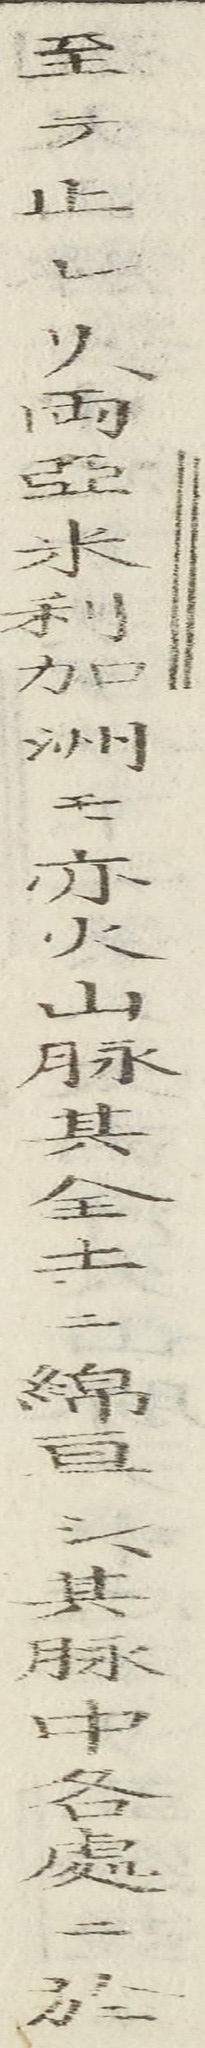至テ止レリ、両亜米利加洲モ亦火山脉其全土ニ綿亘シ、其脉中各処ニ於
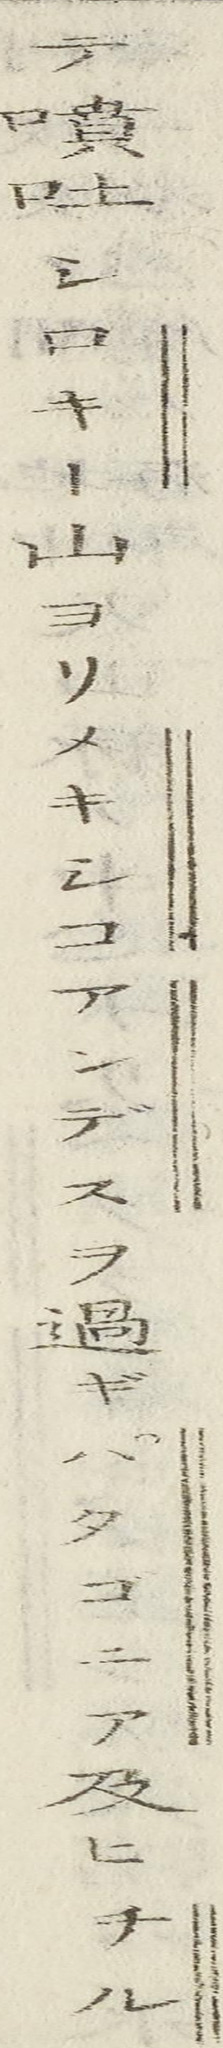テ噴吐シロキー山ヨリメキシコアンデスヲ過ギパタゴニア及ヒチル
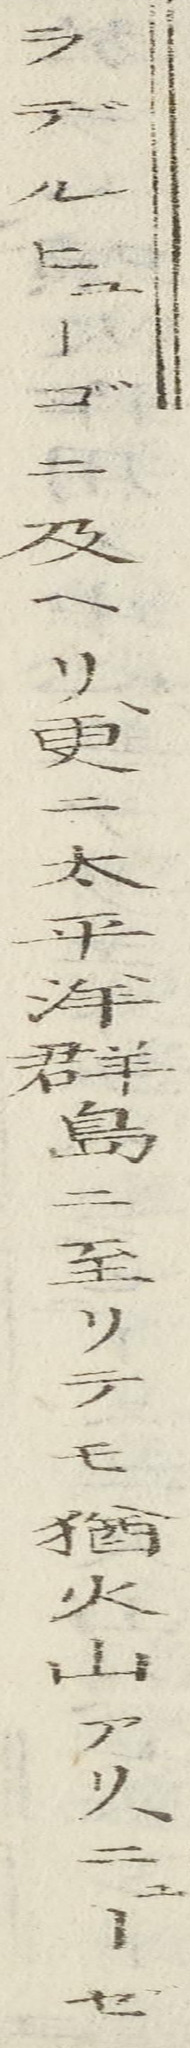ラデルヒューゴニ及ヘリ、更ニ太平洋群島ニ至リテモ猶火山アリ、ニューセ
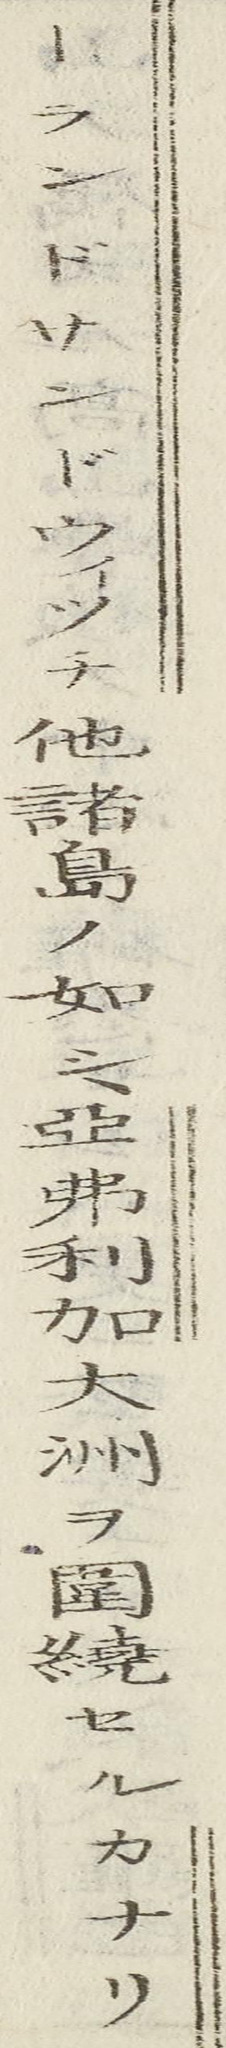ーランドサンドウィツチ他諸島ノ如シ、阿弗利加大洲ヲ囲繞セルカナリ
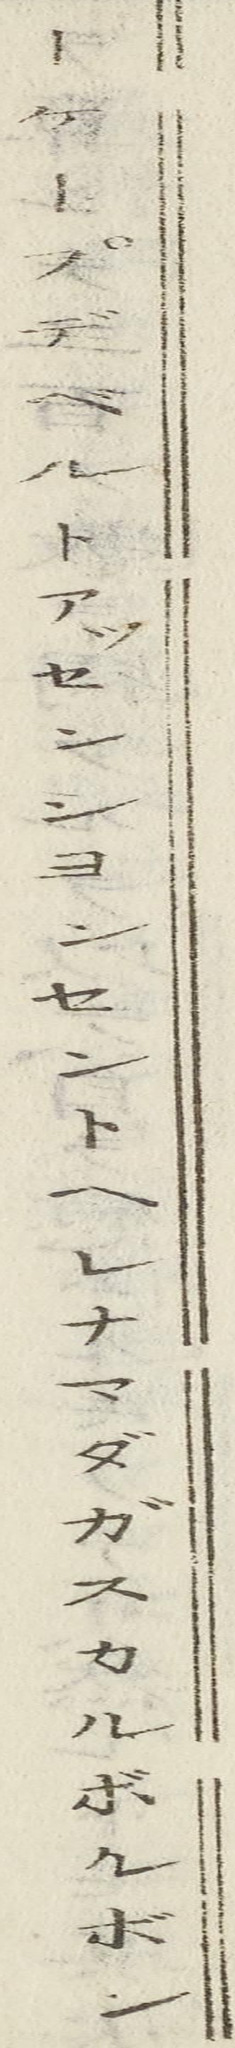ーケープデベルトアッセンションセントヘレナマダガスカルボルボン
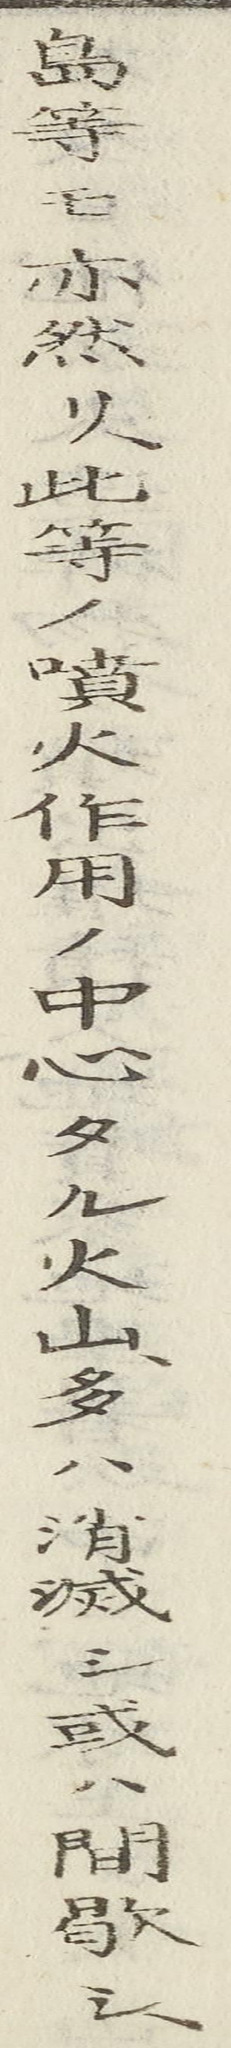島等モ亦然リ、此等ノ噴火作用ノ中心タル火山、多ハ消滅シ或ハ間歇シ、
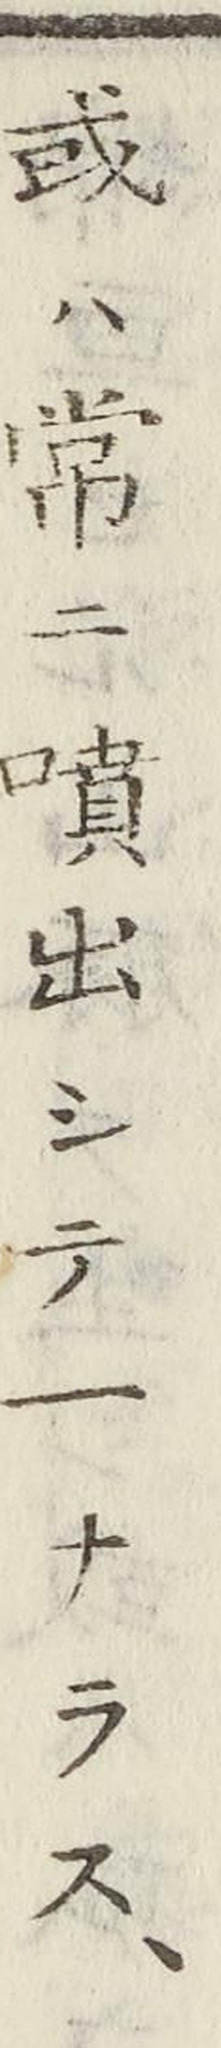或ハ常ニ噴出シテ一ナラス、
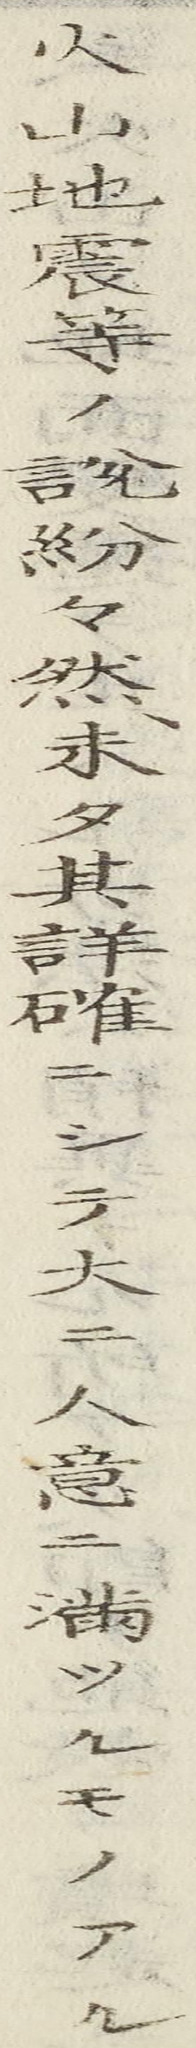火山地震等ノ説紛々然、未タ其詳確ニシテ大ニ人意ニ満ツルモノアル
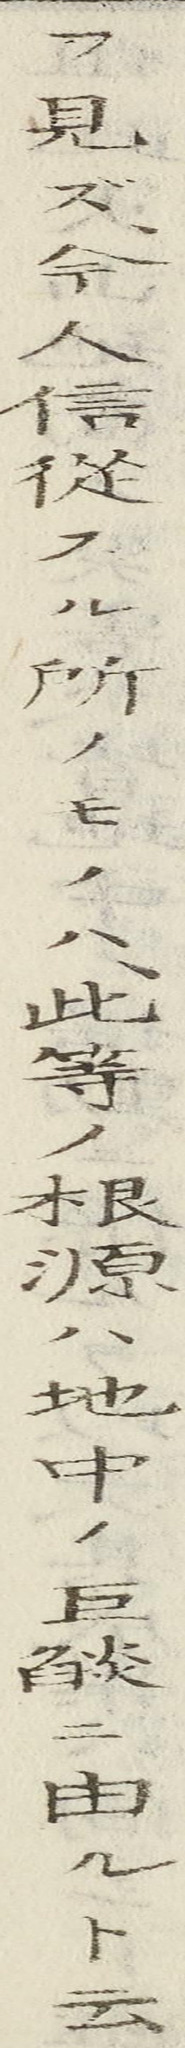ヲ見ズ、今人信従フル所ノモノハ、此等ノ根源ハ地中ノ巨燄ニ由ルト云
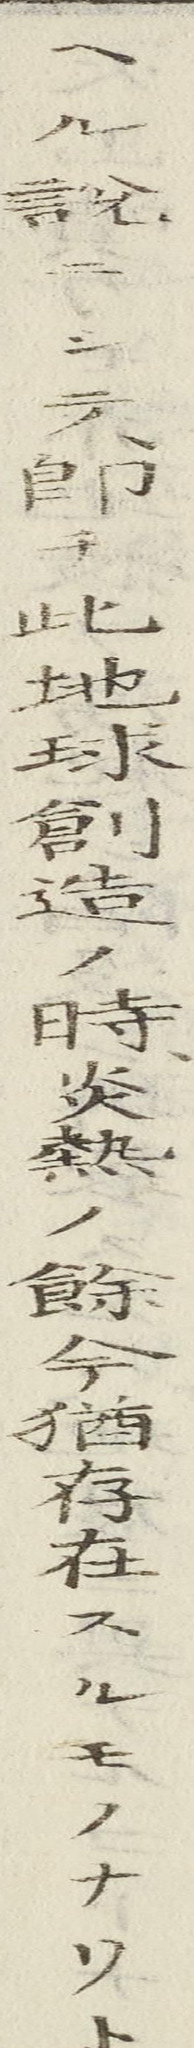ヘル説ニシテ、即チ此地球創造ノ時、炎熱ノ余今猶存在スルモノナリト、
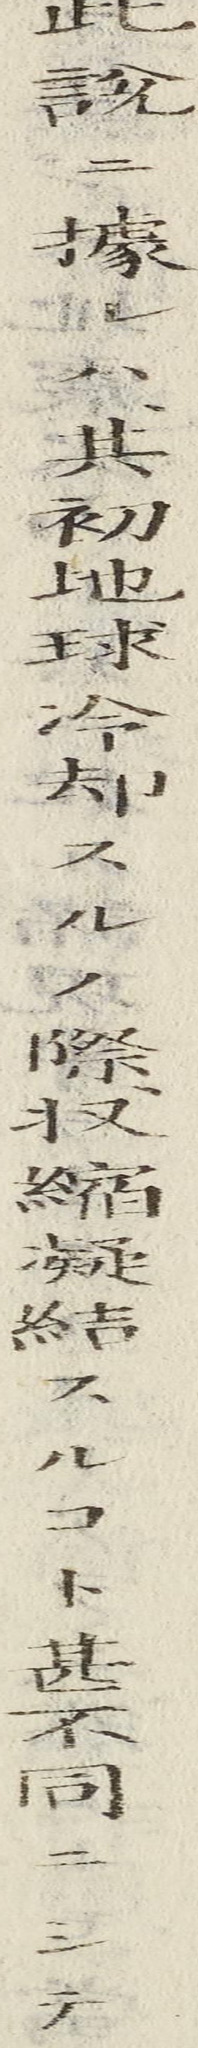此説ニ拠レハ、其初地球冷却スルノ際、収縮凝結スルコト甚不同ニシテ
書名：百科全書　地文學　全
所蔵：東京大学地震研究所図書室 Earthquake Research Institute Library, The University of Tokyo, JAPAN
